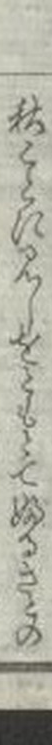秋ことに見しをともとてふるさとの
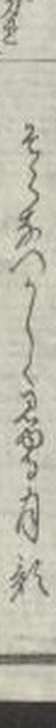そらなつかしく見ゆる月哉
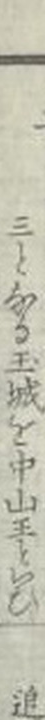三となる玉城を中山王といひ
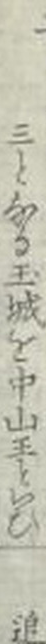三となる玉城を中山王といひ
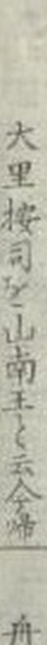大里按司を山南王と云今帰
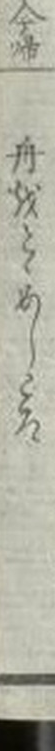舟をとゝめしころ
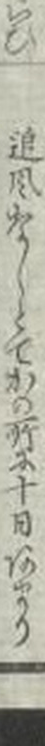追風なしとてかの所に十日あまり
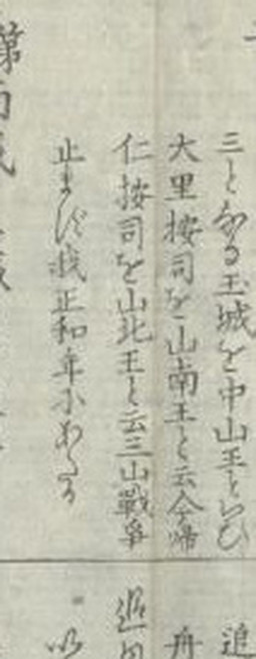仁按司を山北王と云三山戦争
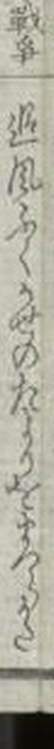追風ふくかせのたよりをまつらかた
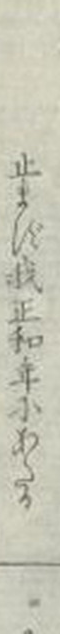止まず我正和年にあたる
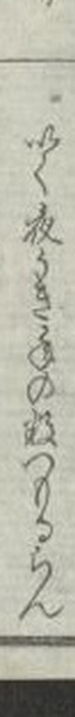いく夜うきねの数つもるらん
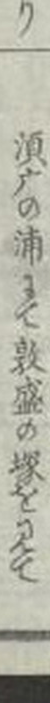須广の浦にて敦盛の塚を見て
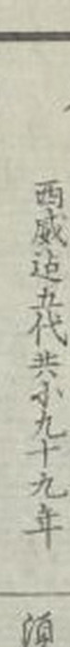西威迠五代共に九十九年
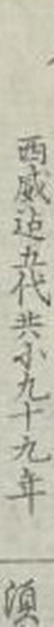西威迠五代共に九十九年
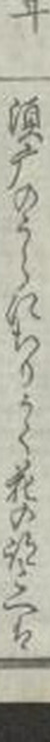須广のうらにちりうく花の数とへは
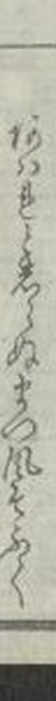あはれとしらぬまつ風そふく
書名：中山国使略
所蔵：University of the Ryukyus Library
